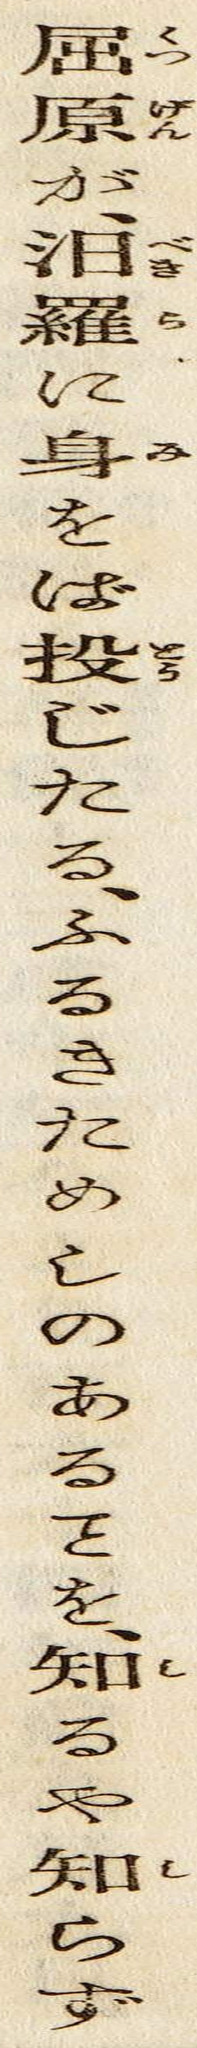屈原が、汨羅に身をば投じたる、ふるきためしのあることを、知るや知らず
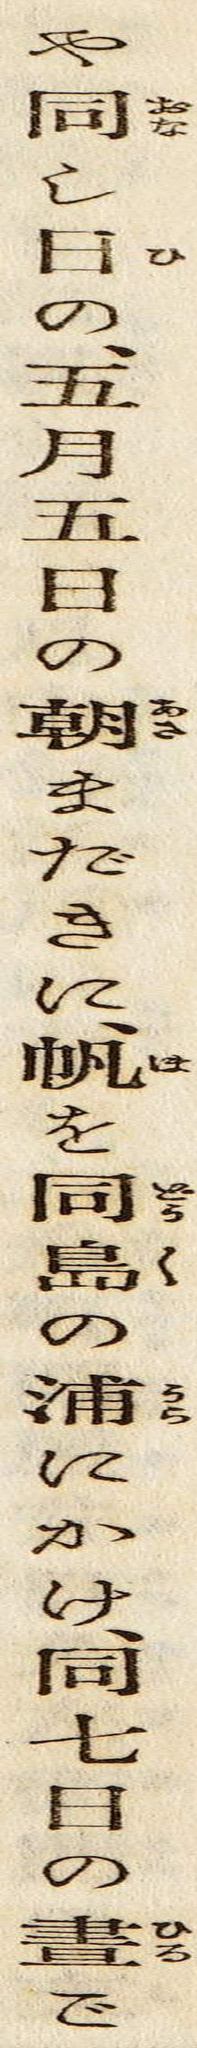や同し日の、五月五日の朝まだきに、帆を同島の浦にかけ、同七日の昼ご
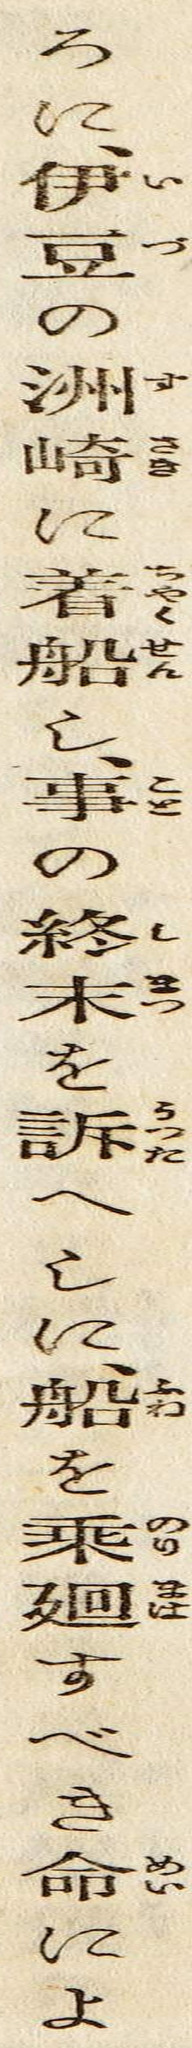ろに、伊豆の洲崎に着船し、事の始末を訴へしに、船を乗廻すべき命によ
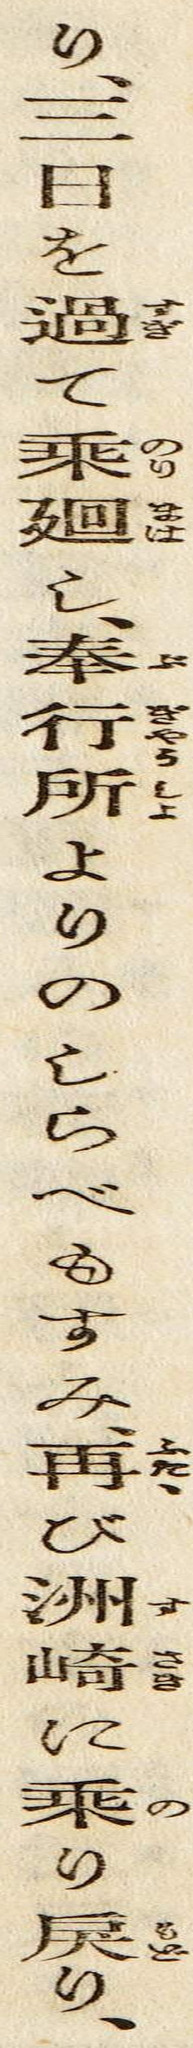り、三日を過て乗廻し、奉行所よりのしらべもすみ、再び洲崎に乗り戻り、
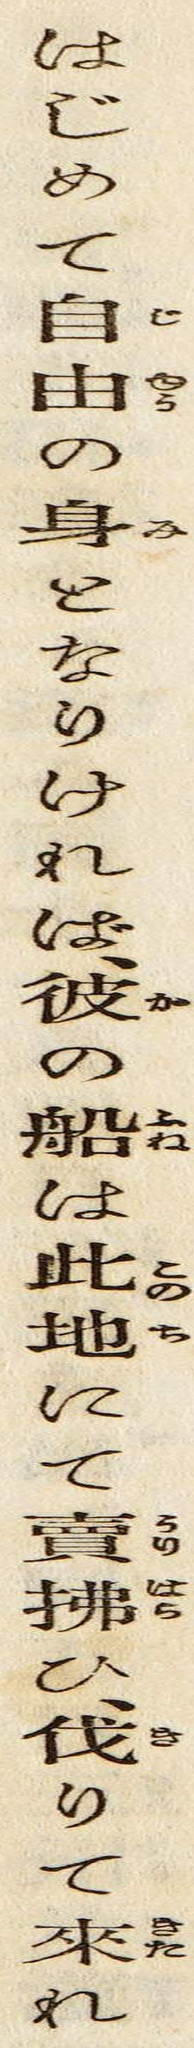はじめて自由の身となりければ、彼の船は此地にて売払ひ、伐りて来れ
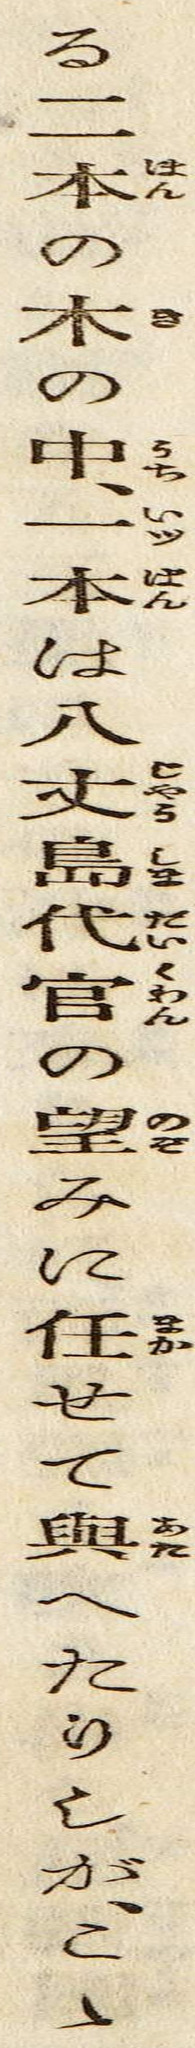る二本の木の中、一本は八丈島代官の望みに任せて与へたりしが、こゝ
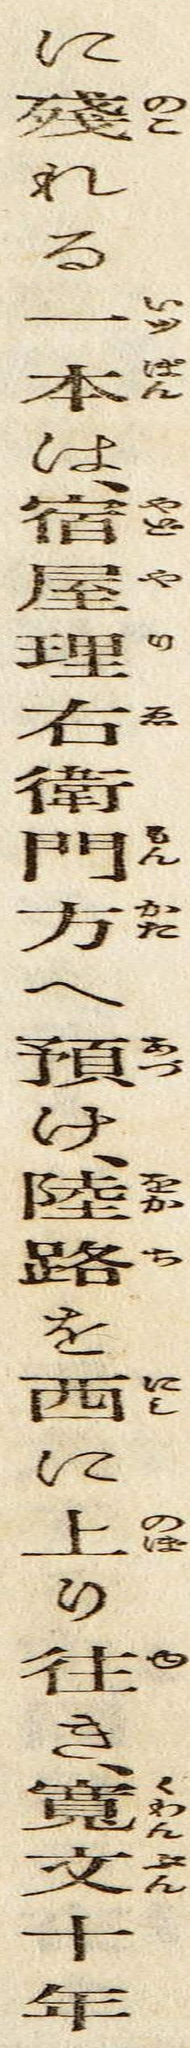に残れる一本は、宿屋理右衛門方へ預け、陸路を西に上り往き、寛文十年
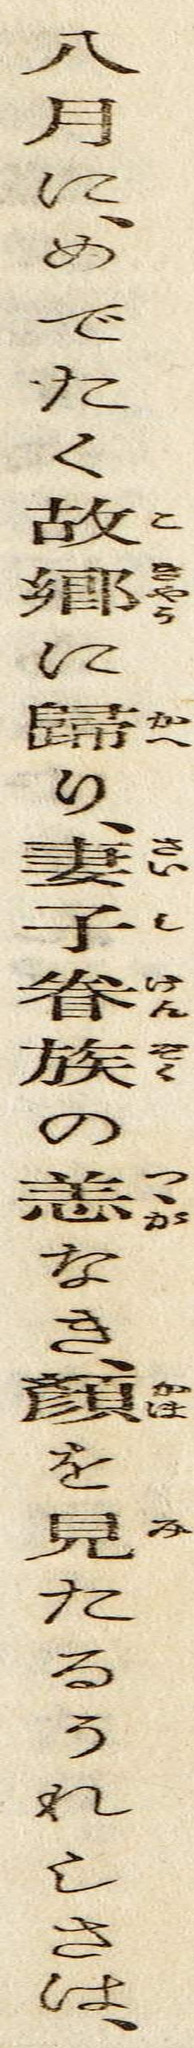八月に、めでたく故郷に帰り、妻子眷族の恙なき、顔を見たるうれしさは、

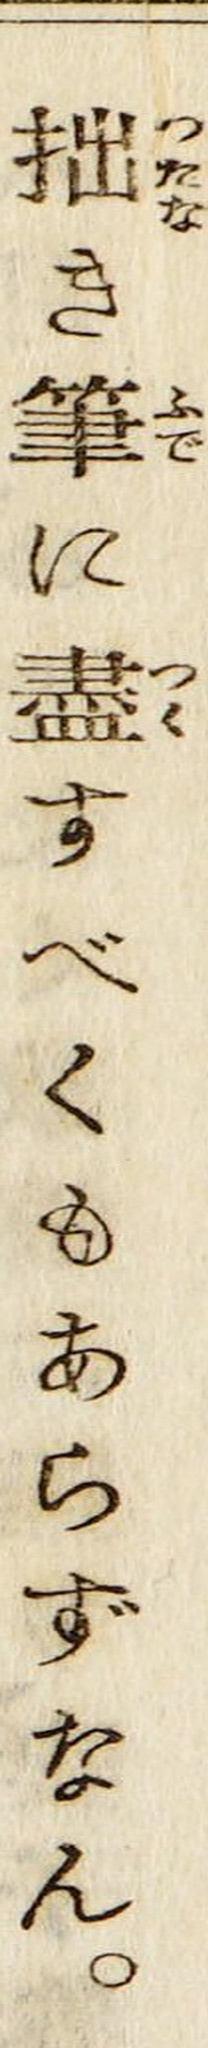拙き筆に尽すべくもあらずなん。
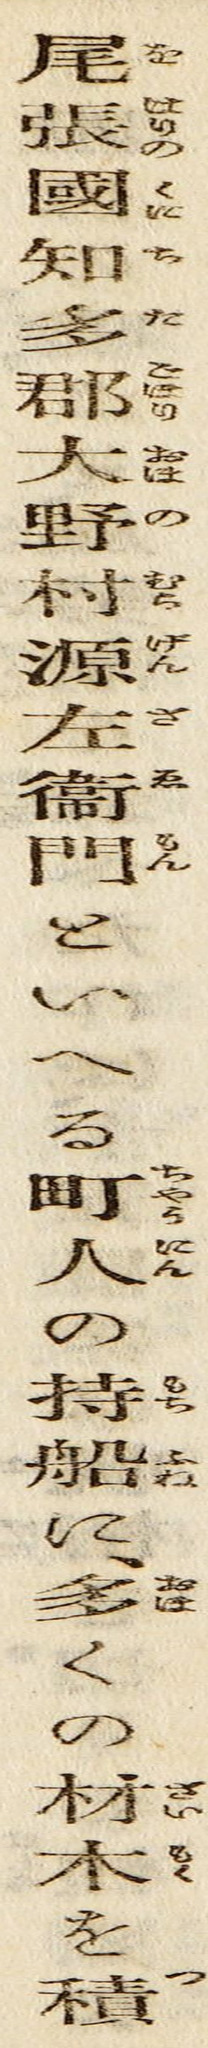尾張国知多郡大野村源左衛門といへる町人の持船に、多くの材木を積
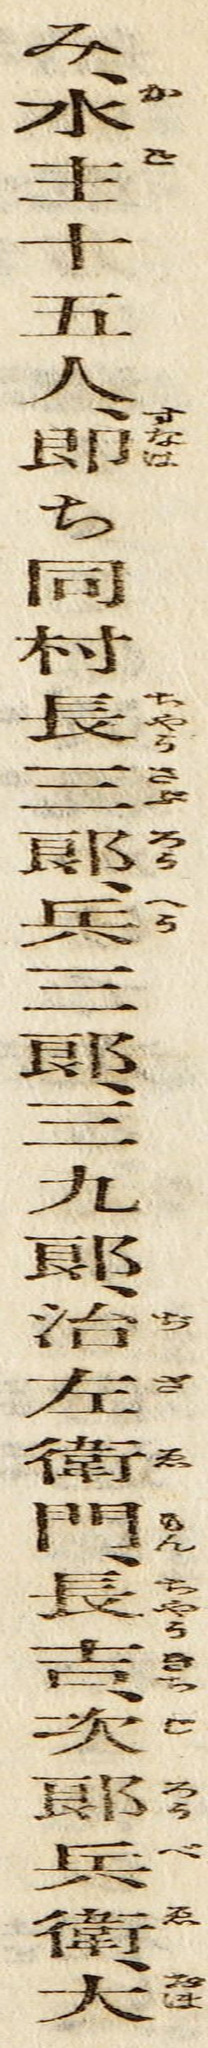み、水主十五人、即ち同村長三郎、兵三郎、三九郎、治左衛門、長吉、次郎兵衛、大
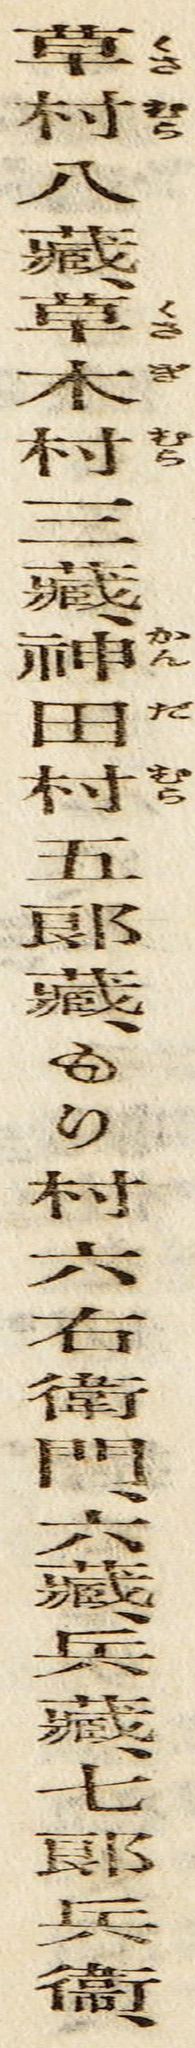草村八蔵、草木村三蔵、神田村五郎蔵、もり村六右衛門、六蔵、兵蔵、七郎兵衛、
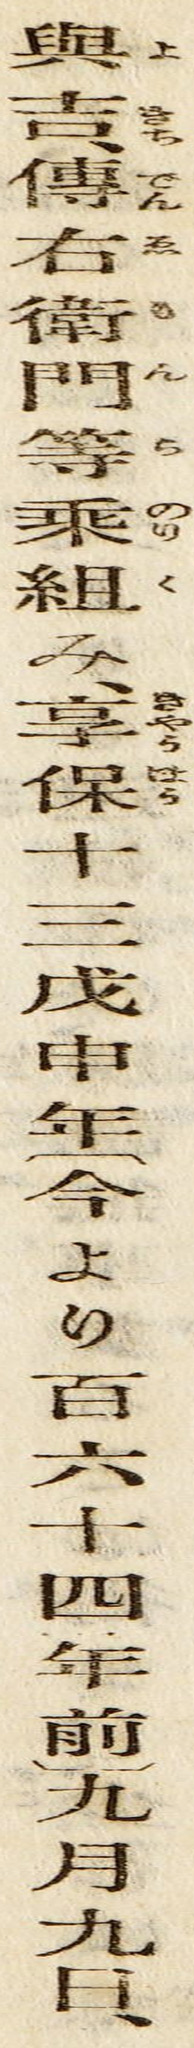与吉、伝右衛門等乗組み、享保十三戊申年[今より百六十四年前]九月九日、
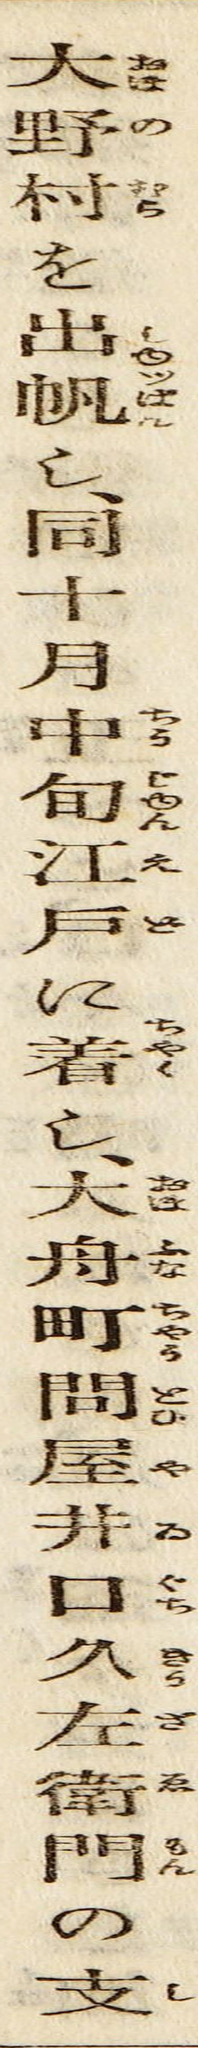大野村を出帆し、同十月中旬江戸に着し、大舟町問屋井口久左衛門の支
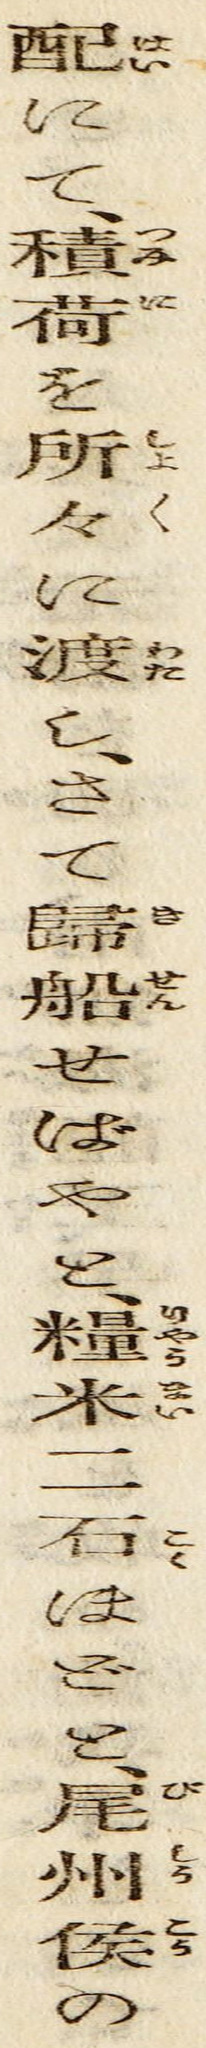配にて、積荷を所々に渡し、さて帰船せばやと、糧米二石ほどと、尾州侯の
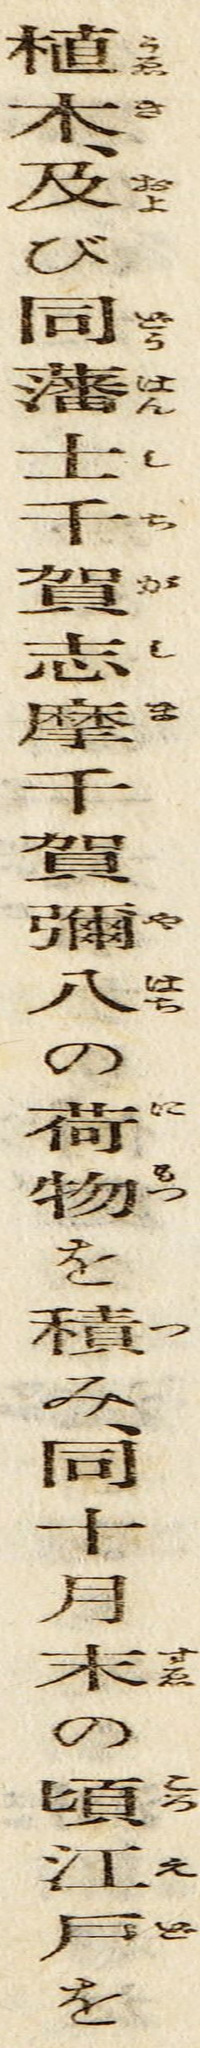植木、及び同藩士千賀志摩千賀弥八の荷物を積み、同十月末の頃江戸を
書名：日本漂流譚
